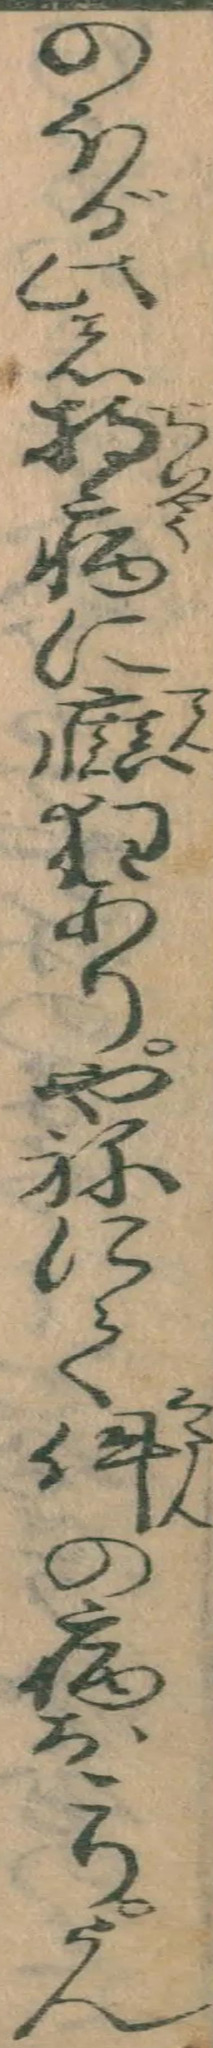のぼる此者持病に癲狂あり。やねにて件の病おこり。うん
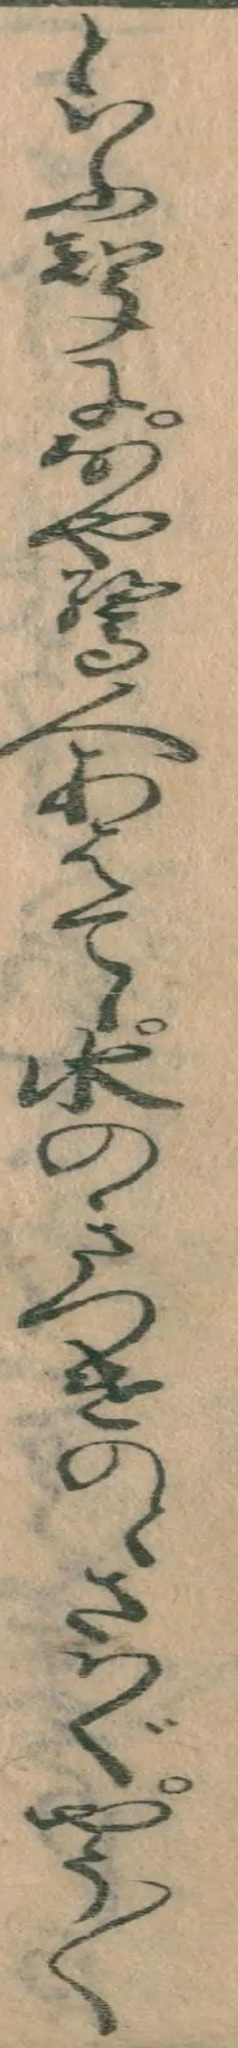といふ声に。おや驚人あはてゝ。水のきつけのとさはぐ。やう〳〵
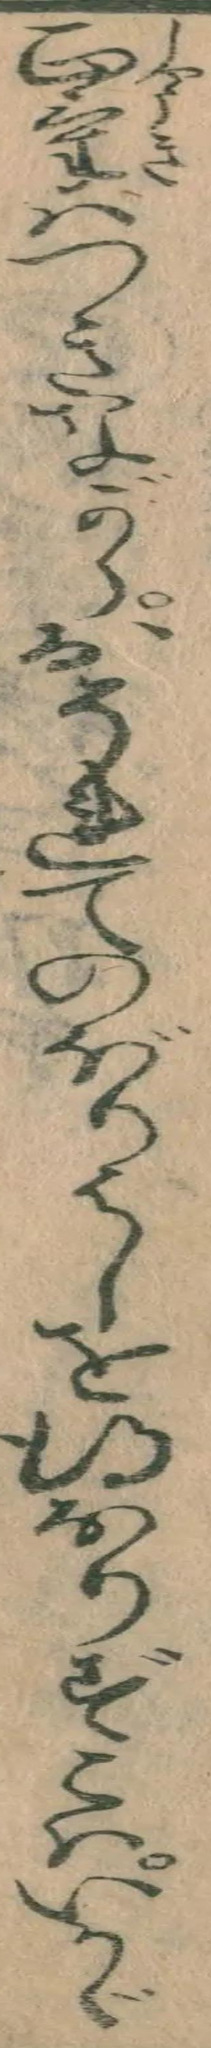正気はつきながら。おそれてのぼりはしを得ほりずこは。いかゞ
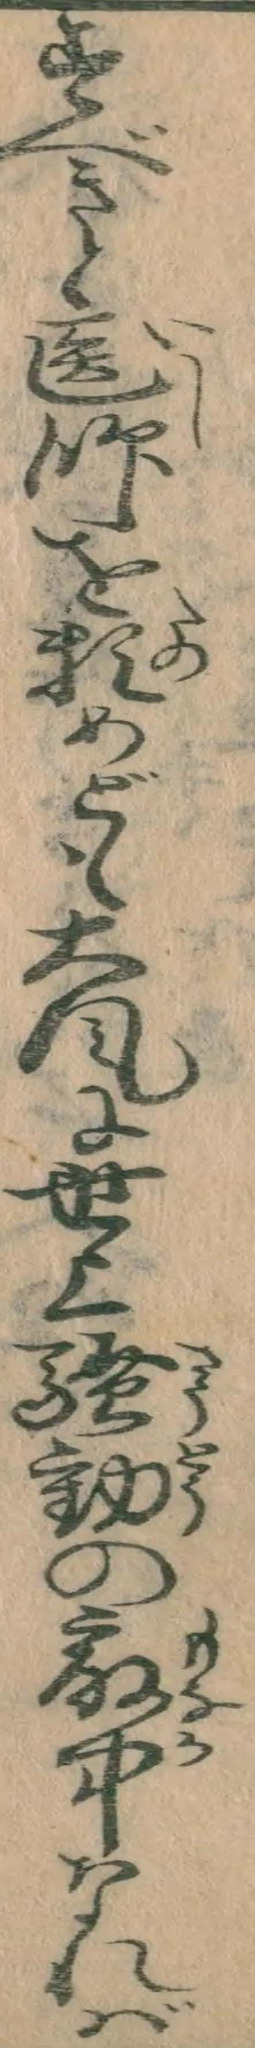すべきと医師を頼めども大風に世上騒動の最中なれば
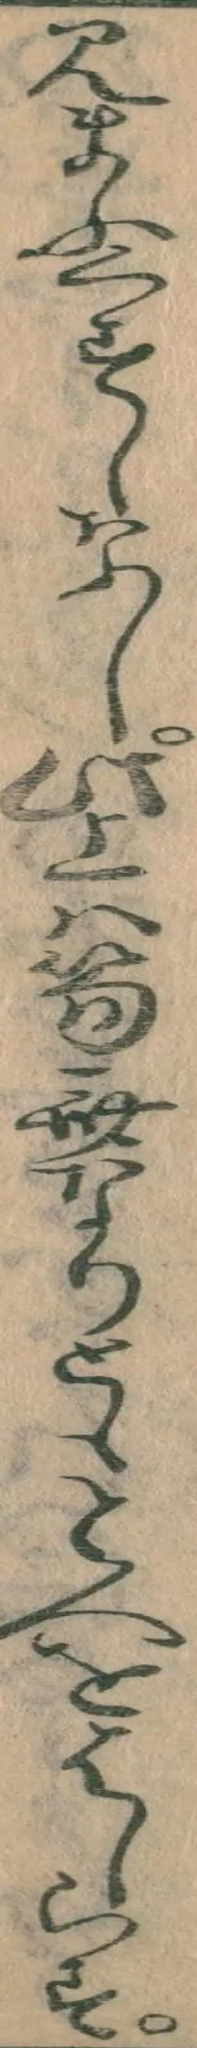見まふくすしなし。此上は筍斎なりともと人をはしらす。
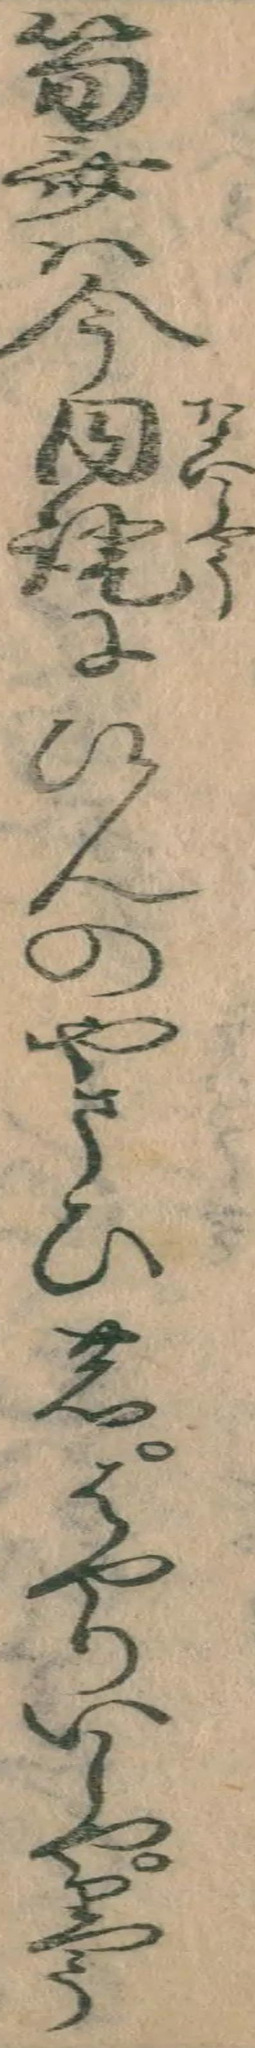筍斎は今内証にひんのやまひ者。はやりいしや。りやう
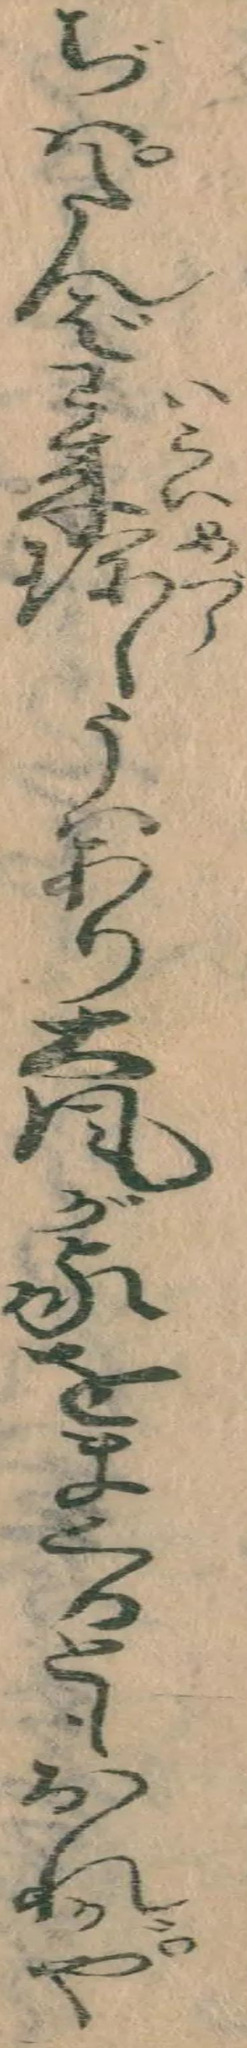ぢは。たんば已来珍しうはあり大風が家をまくるともおれが。や
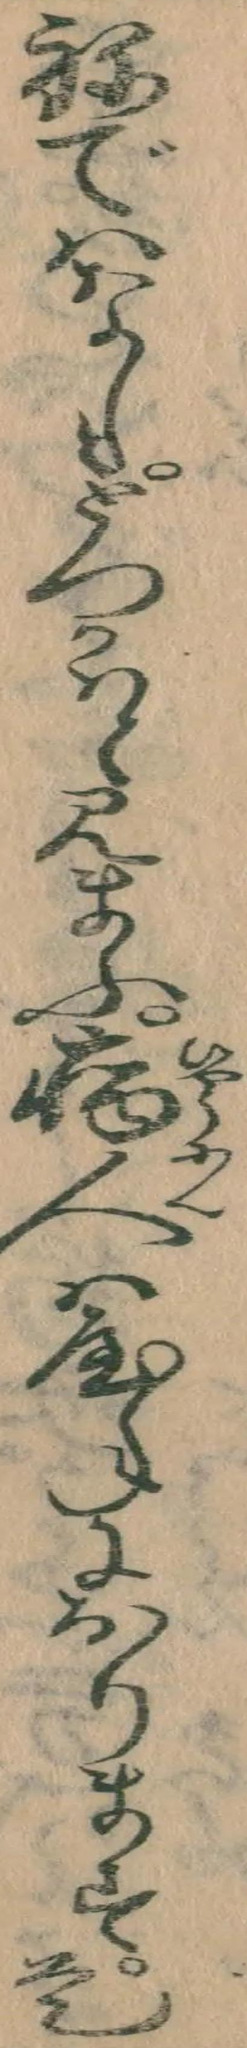ねではなしと。とつかはと見まふ。病人はやねにおります。是
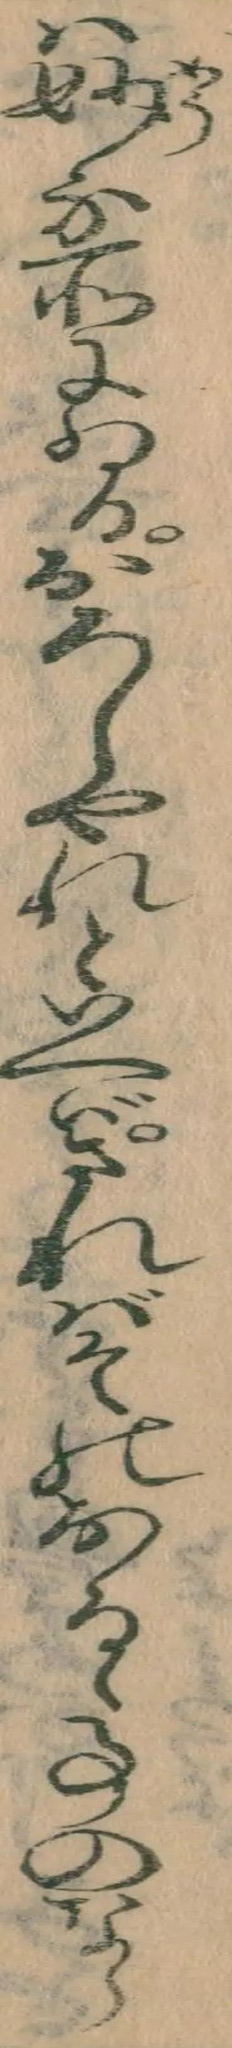は妙な所にゐる。おろしやれといへば。さればそのおるゝ事のなら
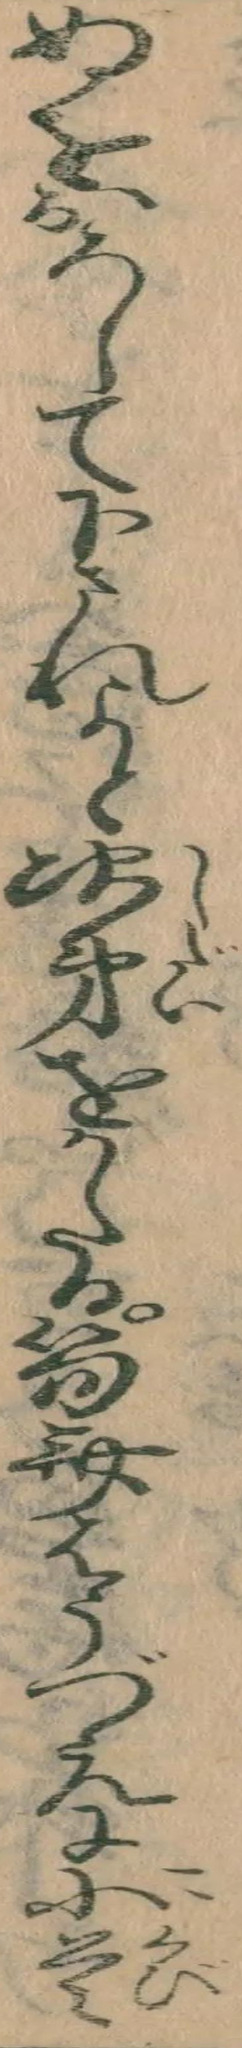ぬをおろして下されよと次第をかたる。筍斎はうづえに小首
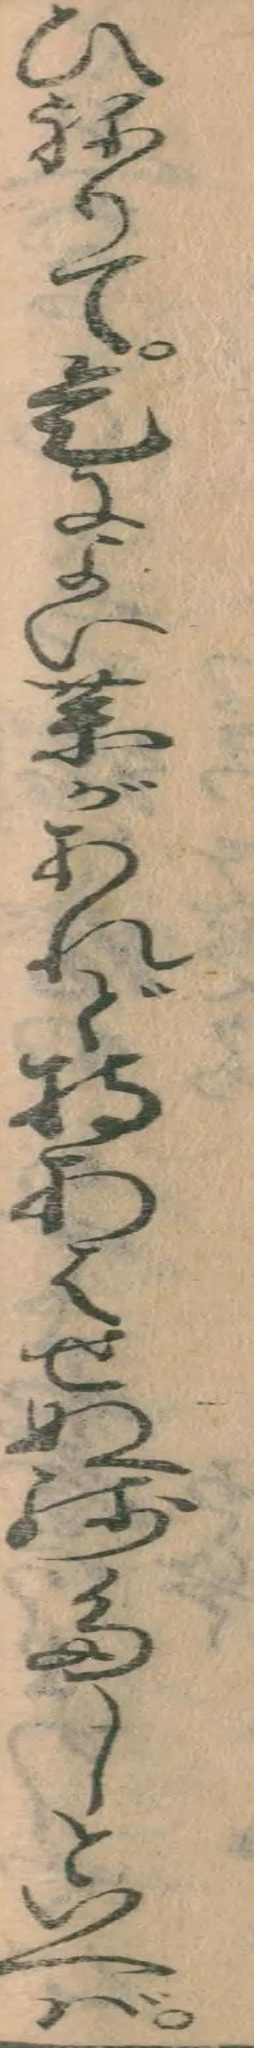ひねりて。是によい薬があれど持あはせぬ残多しといへば。
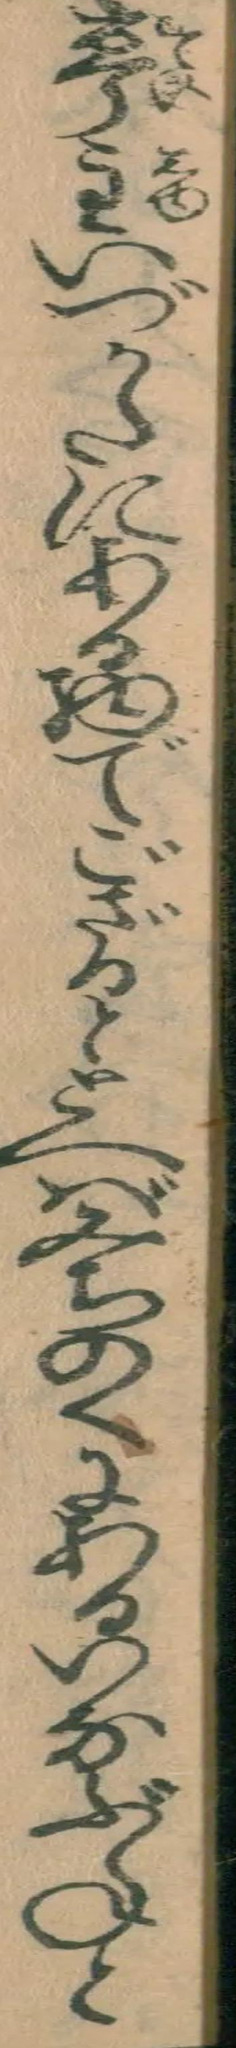亭主いづかたにある物でござるととへばみちのくにあるいなぶねと
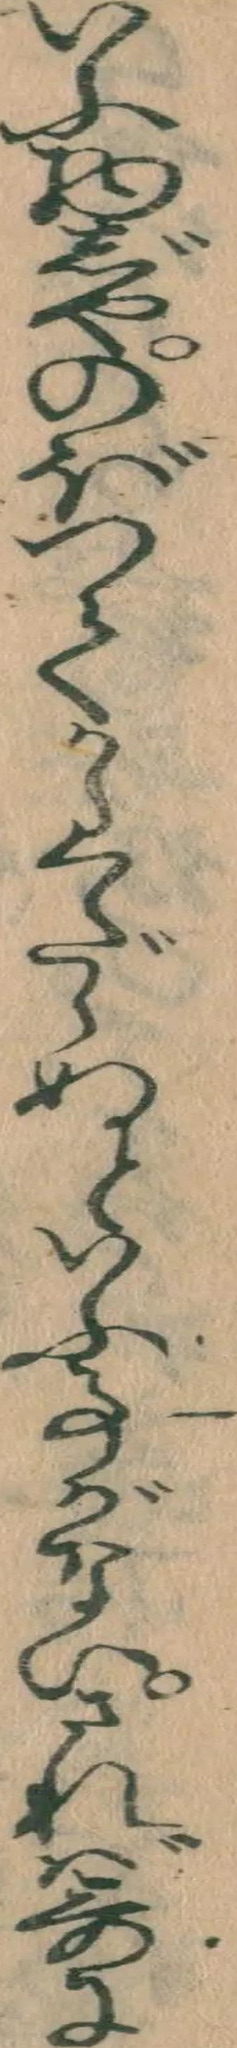いふ物じや。のぼつてからくだらぬといふ事がない。されば歌に
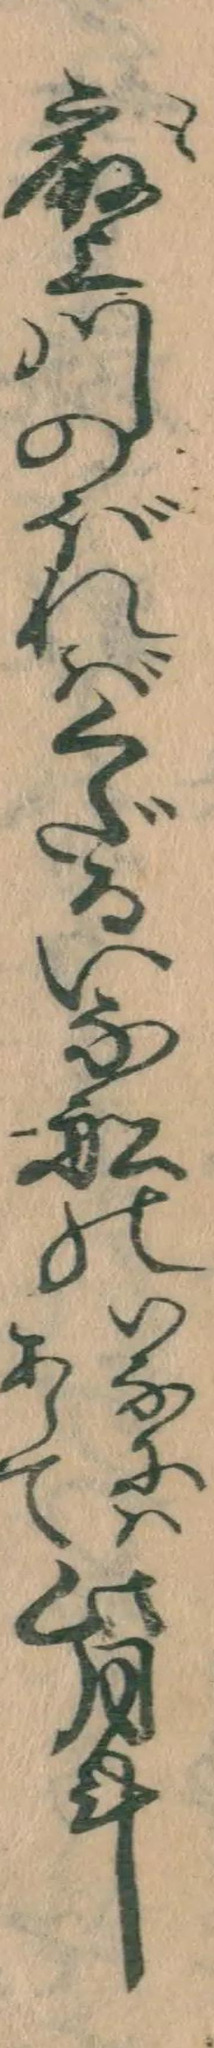最上川のぼればくだるいな船のいなにはあらて此月斗
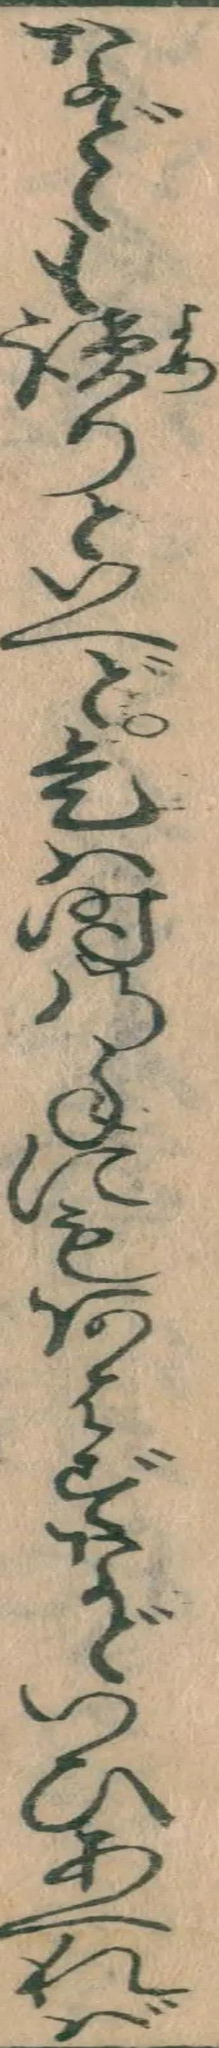などゝも読りといへど。是は時の手にもあはずなどいひあへれば
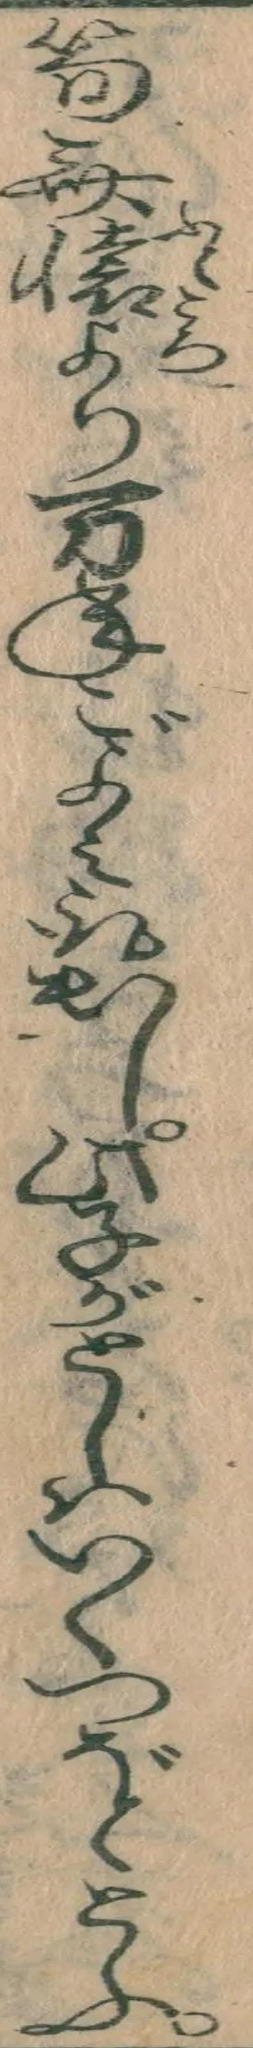筍斎懐より万年ごよみ取出し。此子がとしはいくつぞととふ。
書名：新竹斎 5巻
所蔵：国立国会図書館 National Diet Library, JAPAN
